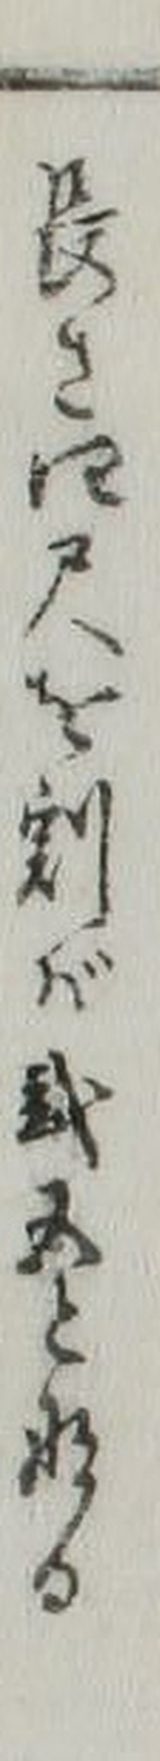長さ四尺を割ば弐五となる
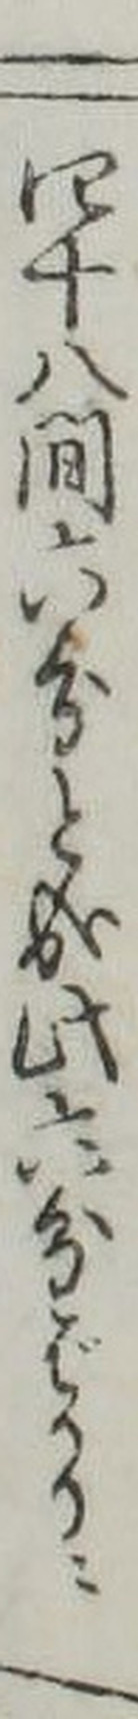四十八間六分と成此六分ばかりに
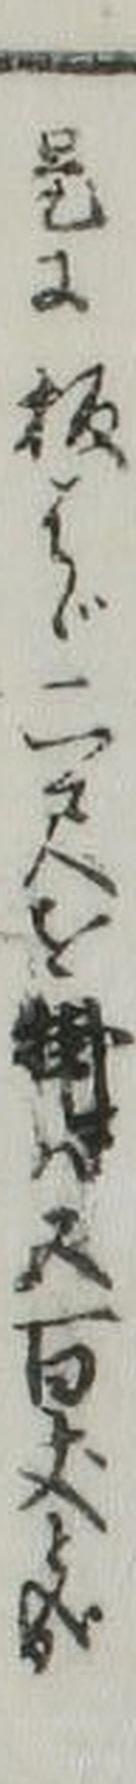是に板はゞ二尺を掛ば五百丈と成
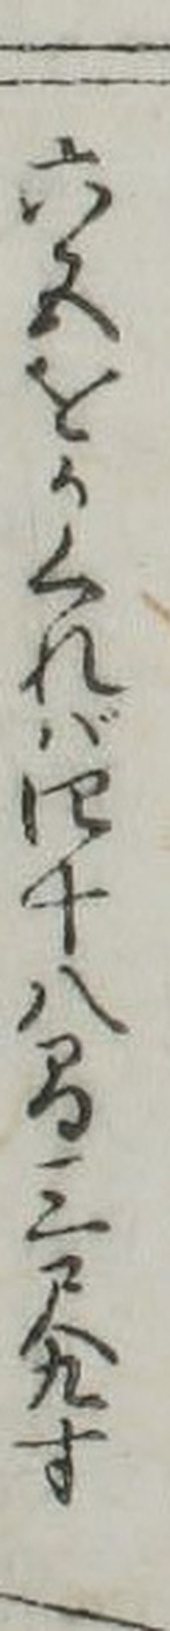六五をかくれば四十八間三尺九寸
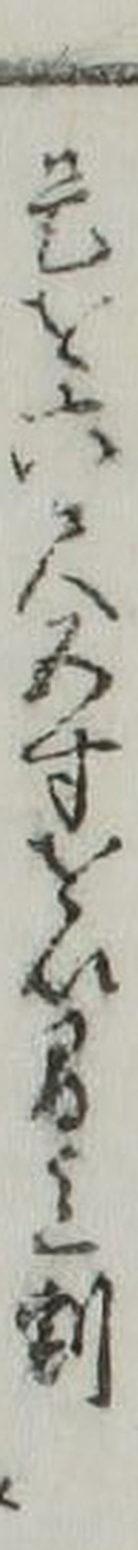是を六尺五寸を以間迄割
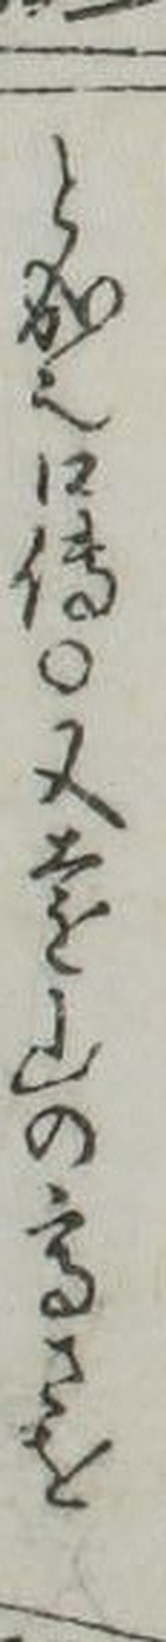と成也口伝○又遠山の高さを
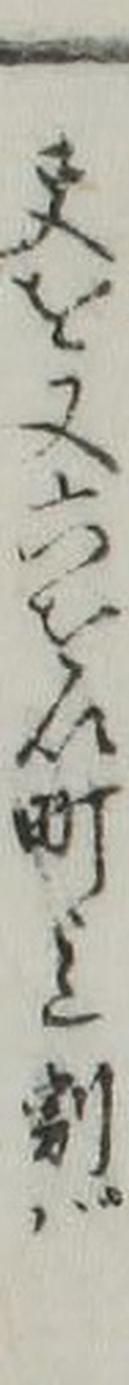夫を又六を以町迄割ば
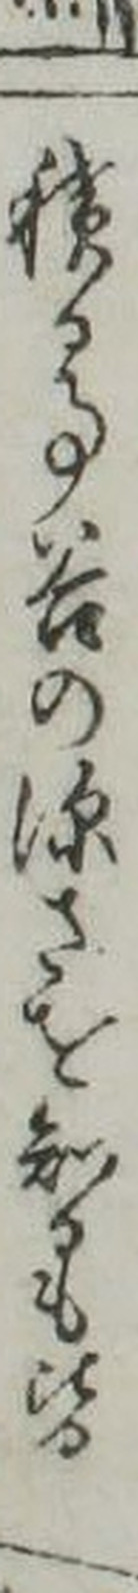積る事谷の深さを知るも皆
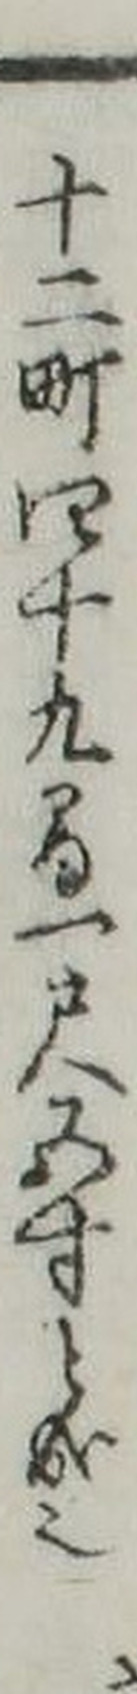十二町四十九間一尺五寸と成也
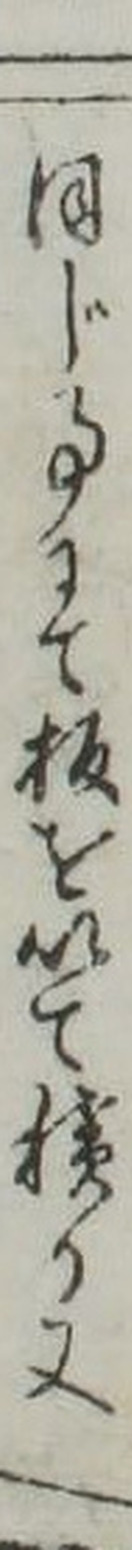同じ事にて板を以て積り又

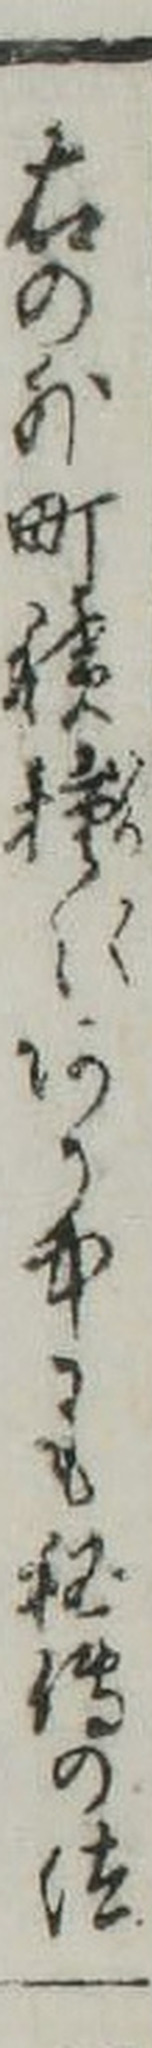右の外町積種々あり中にも秘伝の法
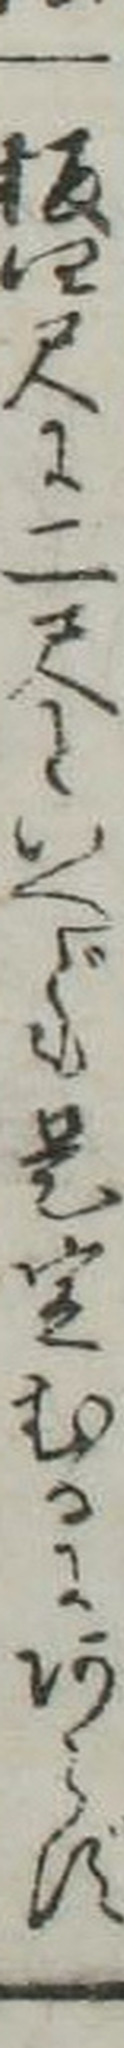板四尺に二尺といへども是定むるにあらず
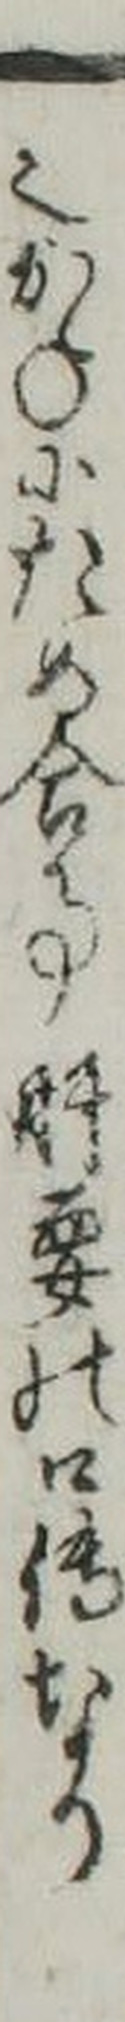也かねにため合事肝要の口伝なり
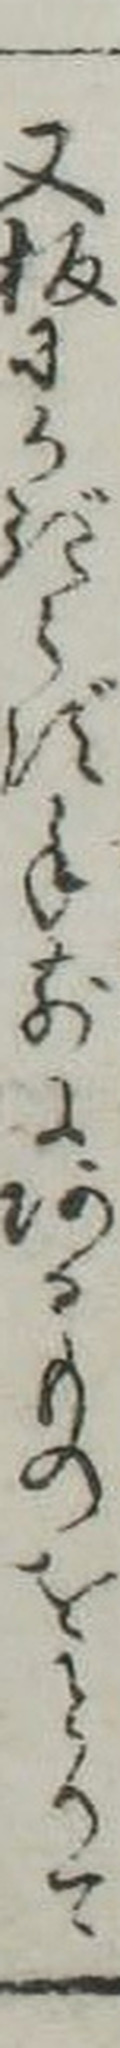又枚にかぎらず手前にあるものをとりて
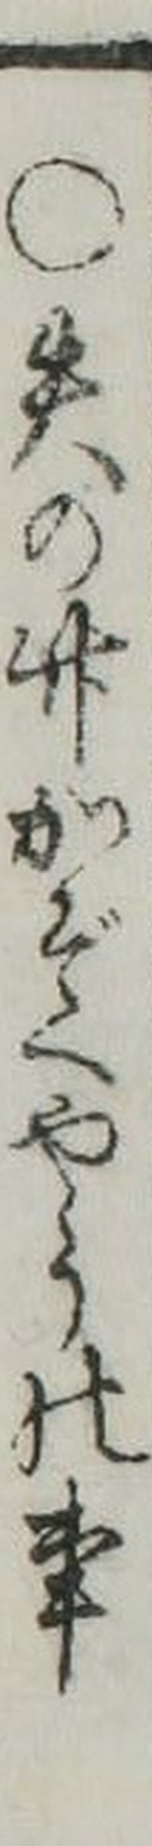○矢の竹のかぞへやうの事
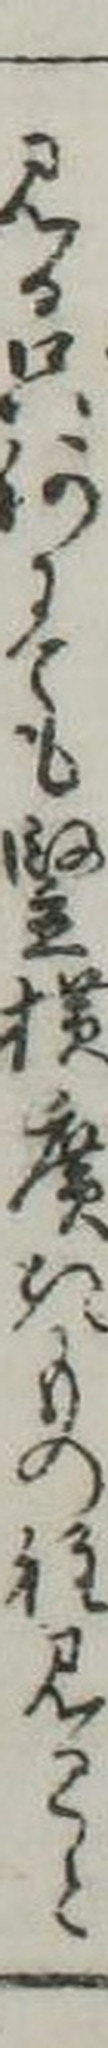見る只何にても竪横広きもの程見ること
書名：宝玉塵劫記
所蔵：東京学芸大学教育コンテンツアーカイブ
